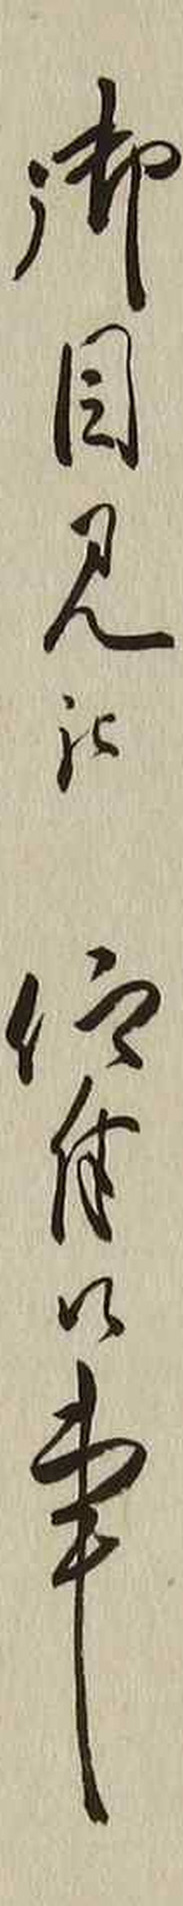御目見被仰付候事
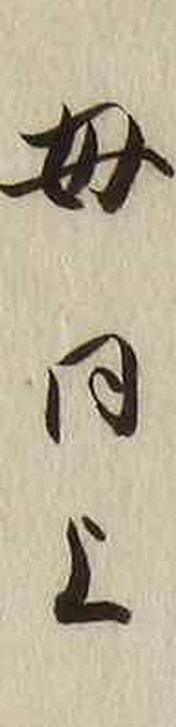母同上
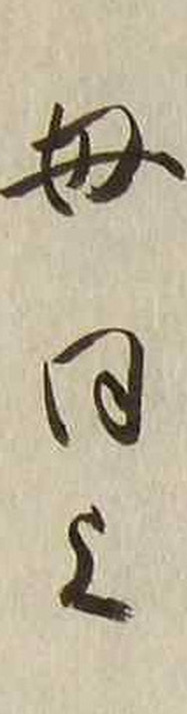母同上

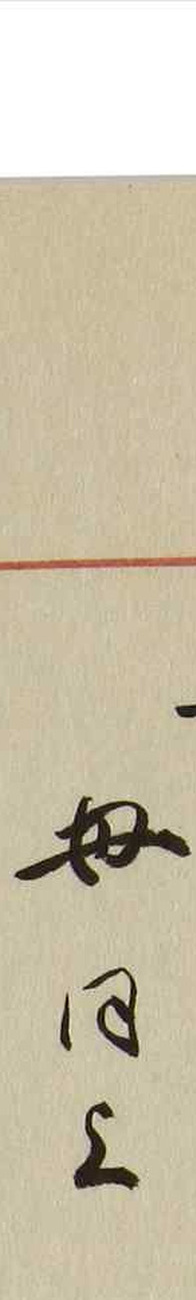母同上
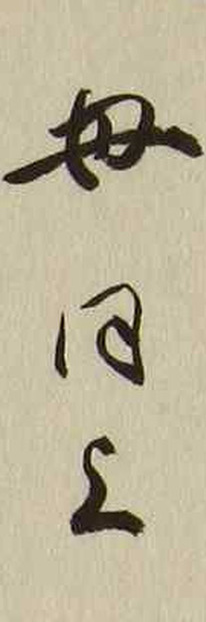母同上
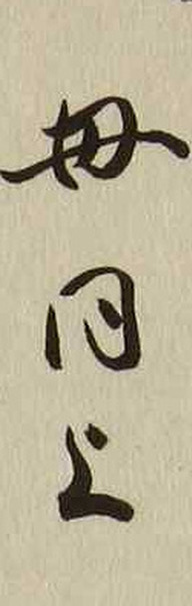母同上
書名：諸士系譜　巻之15　い之部15
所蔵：会津若松市立会津図書館
